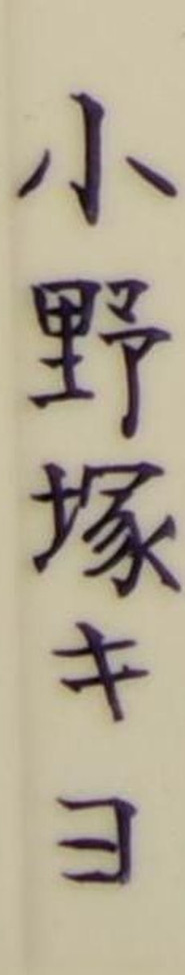小野塚キヨ

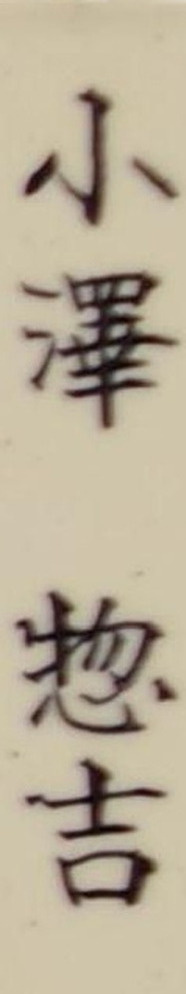小澤惣吉
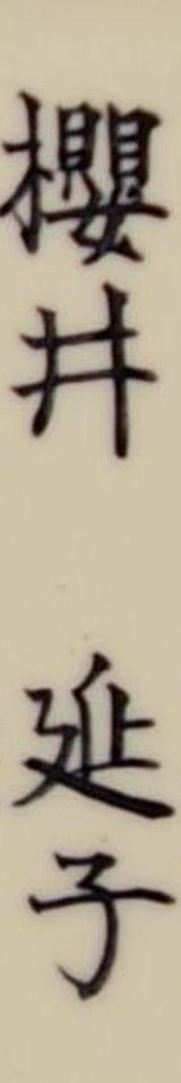桜井延子
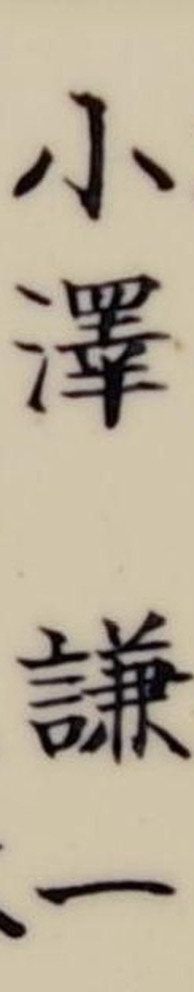小澤謙一
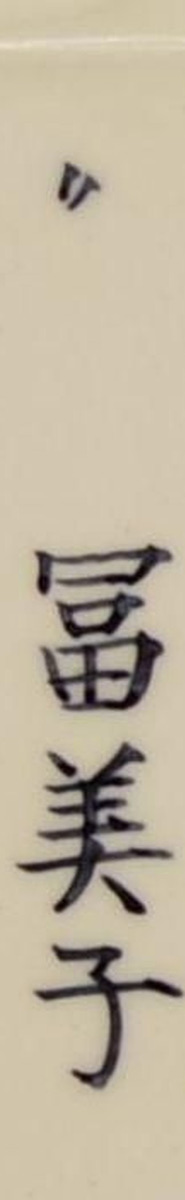冨美子
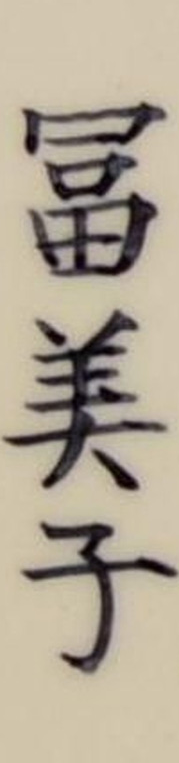冨美子
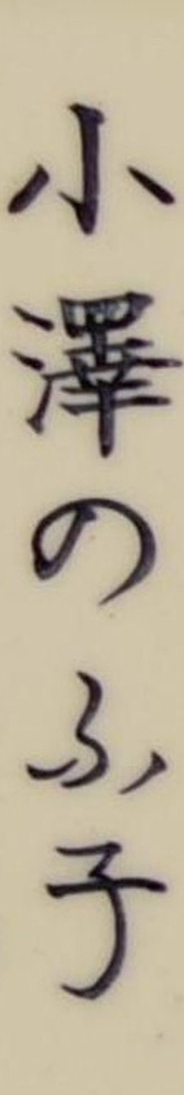小澤のふ子
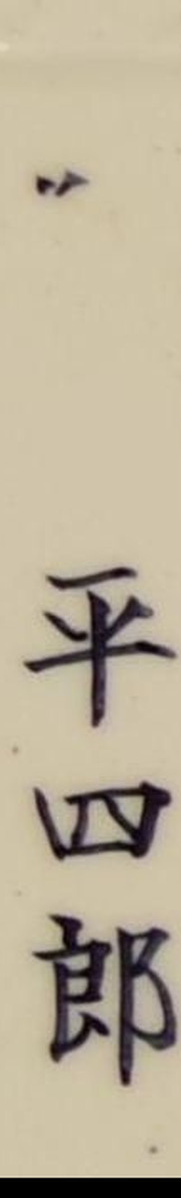平四郎
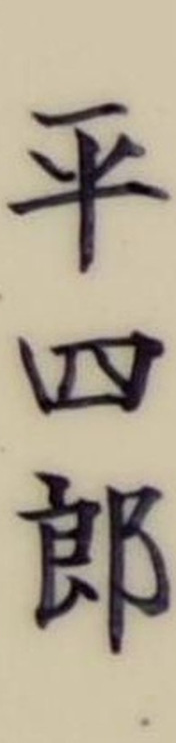平四郎

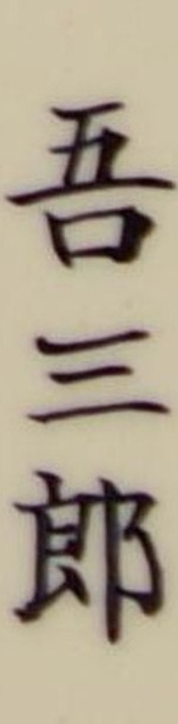吾三郎
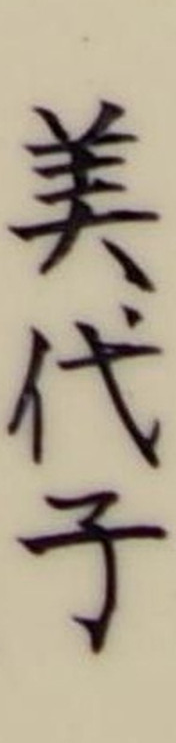美代子
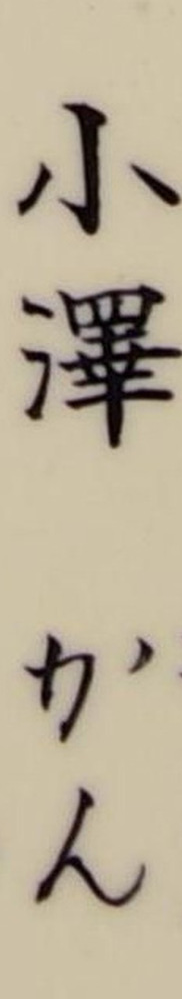小澤かん
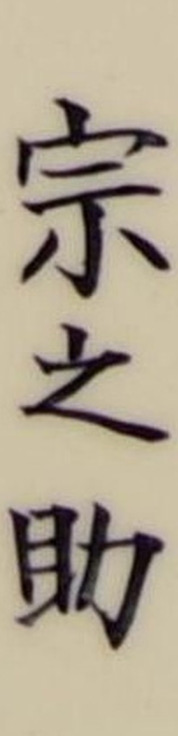宗之助
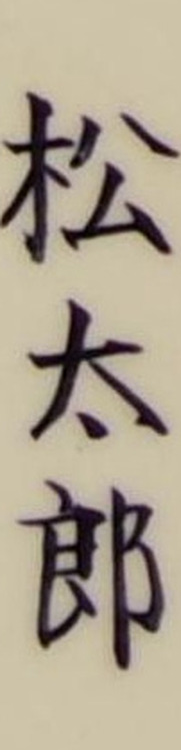松太郎
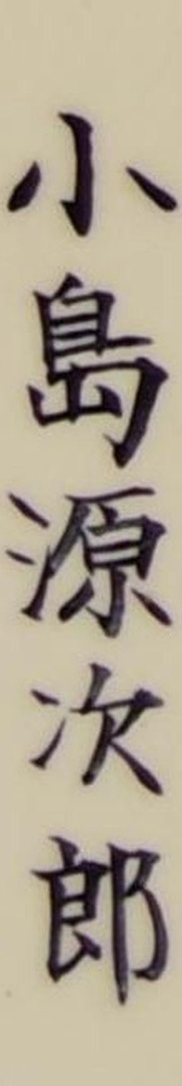小島源次郎
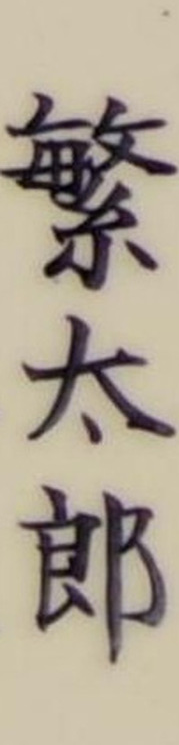繁太郎
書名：E~L
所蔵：高野山金剛峯寺
